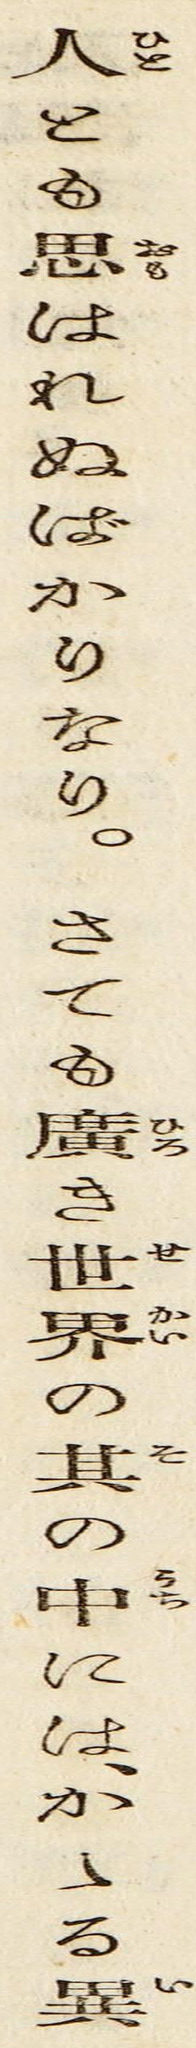人とも思はれぬばかりなり。さても広き世界の其の中には、かゝる異
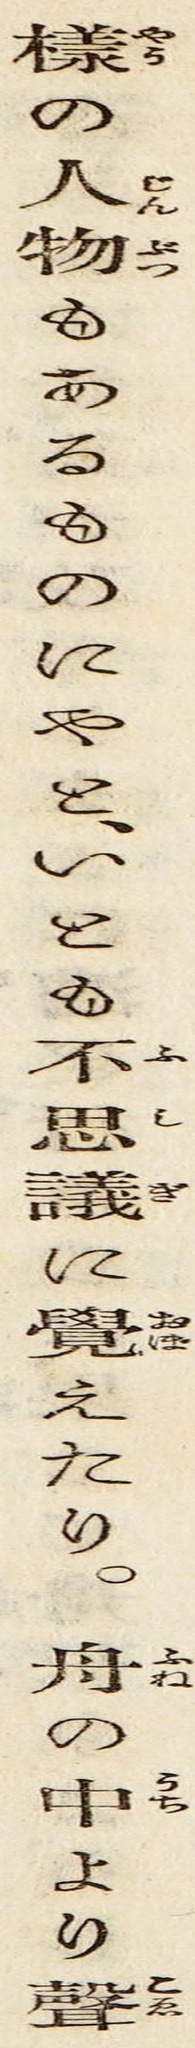様の人物もあるものにやと、いとも不思議に覚えたり。舟の中より声
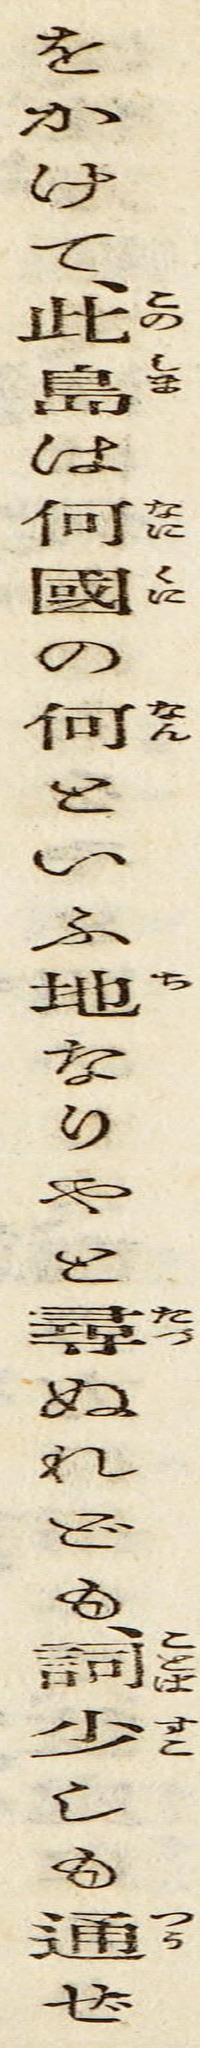をかけて、此島は何国の何といふ地なりやと尋ぬれども、詞少しも通ぜ
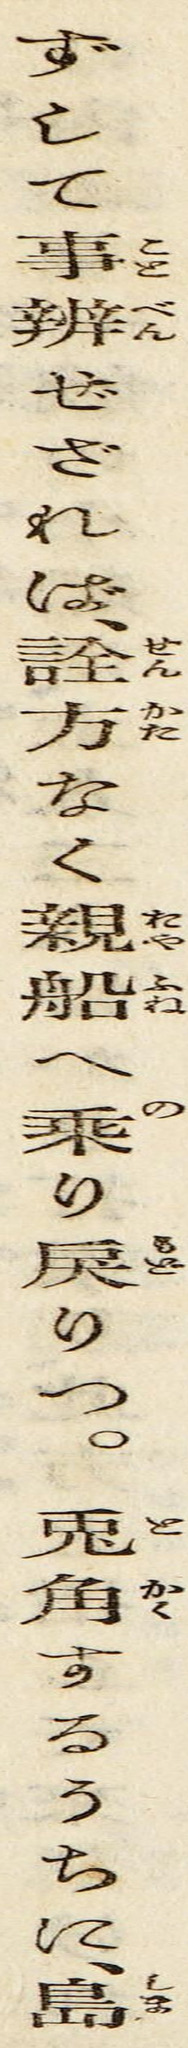ずして事弁ぜざれば、詮方なく親船へ乗り戻りつ。兎角するうちに、島

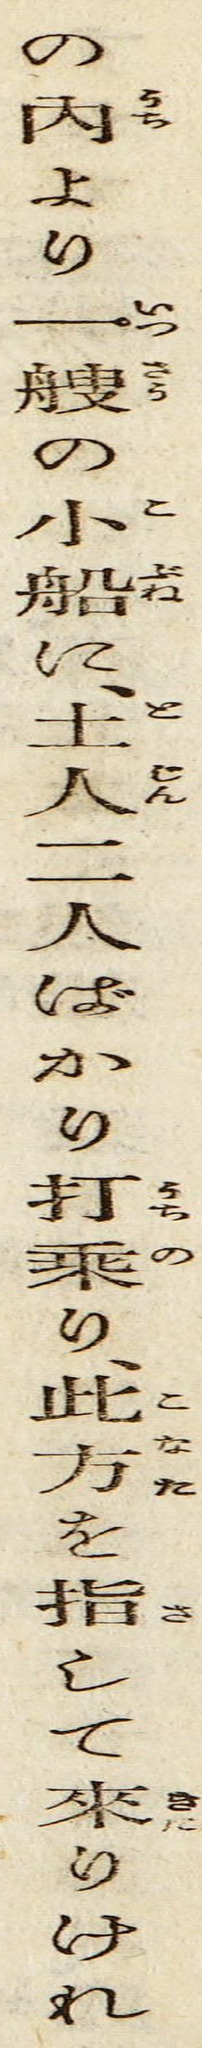の内より一艘の小船に、土人二人ばかり打乗り、此方を指して来りけれ
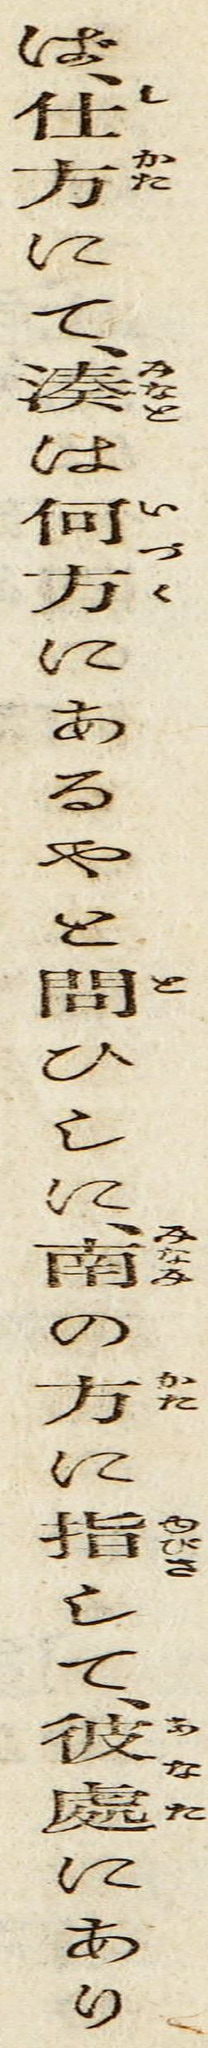ば、仕方にて、湊は何方にあるやと問ひしに、南の方に指して、彼処にあり
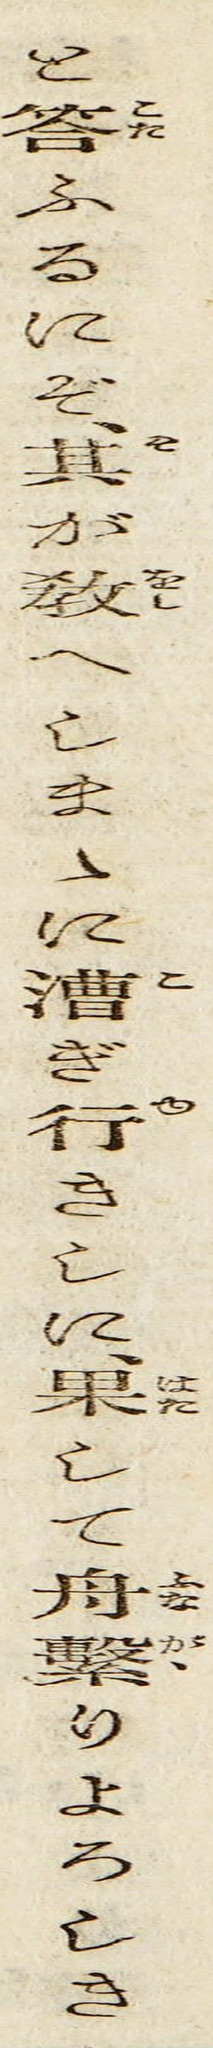と答ふるにぞ、其が教へしまゝに漕ぎ行きしに、果して舟繋りよろしき
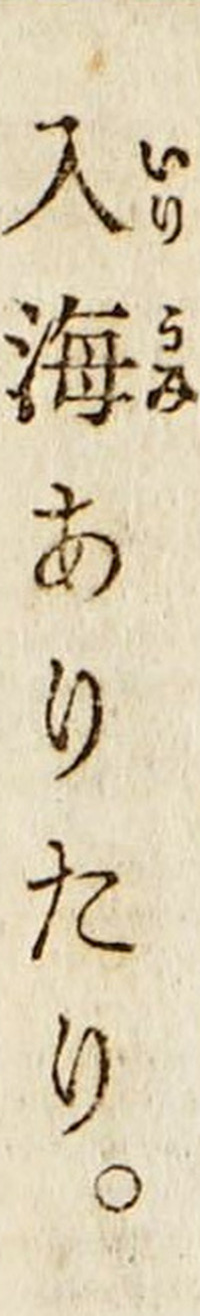入海ありたり。
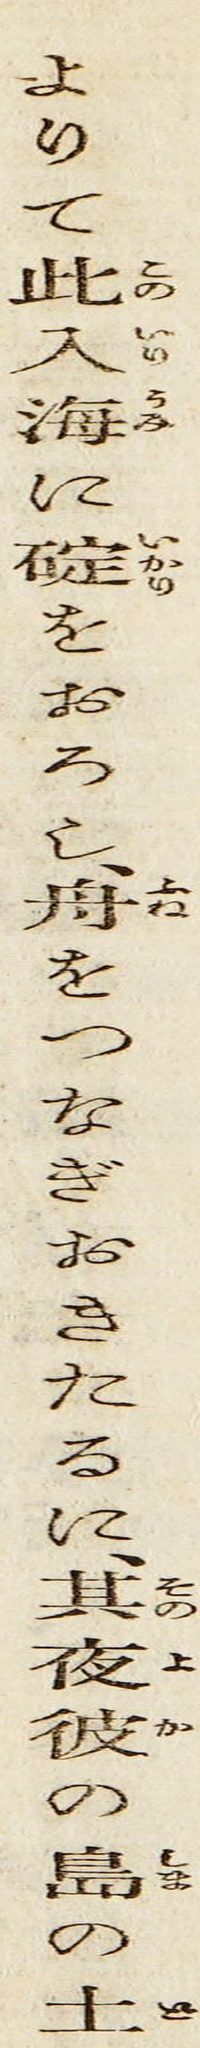よりて此入海に碇をおろし、舟をつなぎおきたるに、其夜彼の島の土
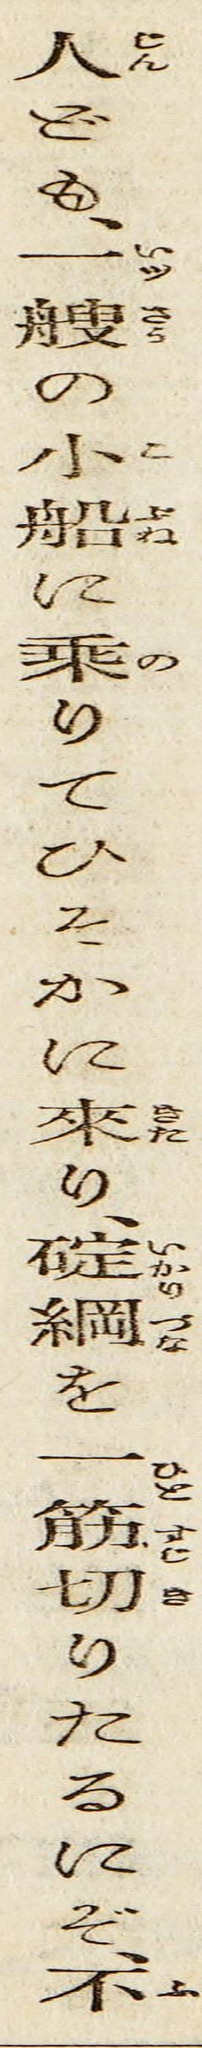人ども、一艘の小船に乗りてひそかに来り、碇綱を一筋切りたるにぞ、不
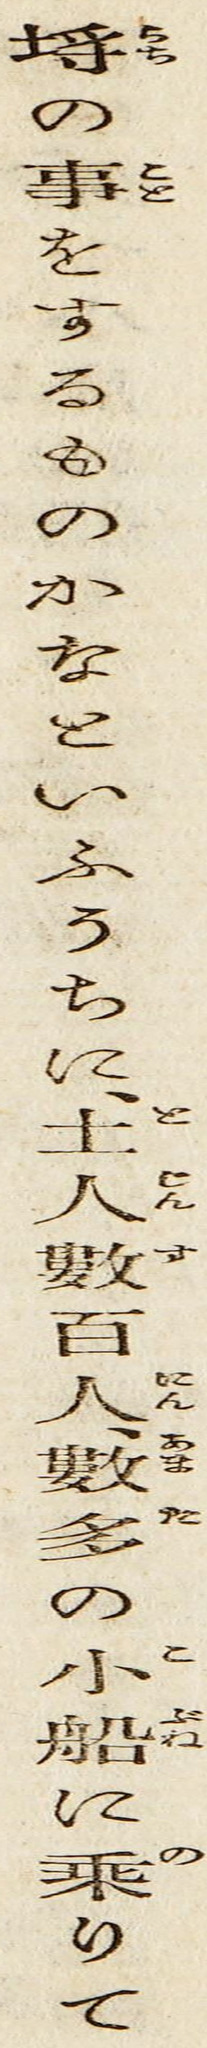埒の事をするものかなといふうちに、土人数百人、数多の小船に乗りて
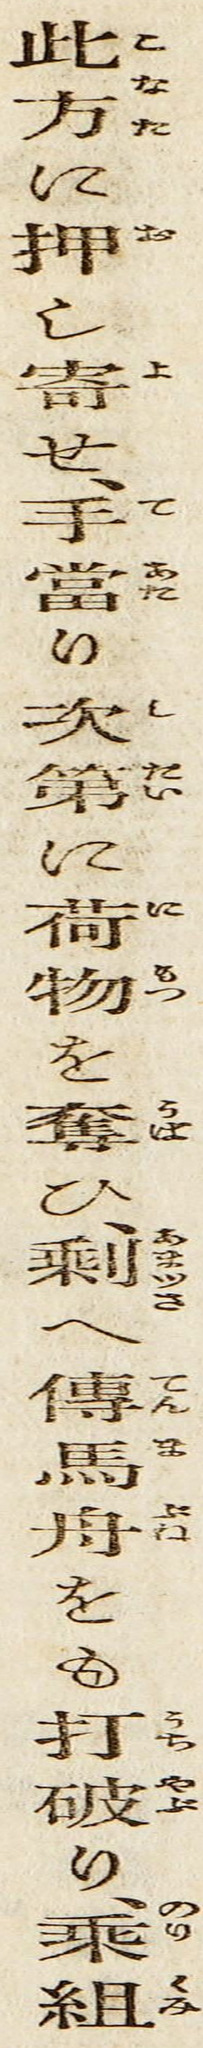此方に押し寄せ、手当り次第に荷物を奪ひ、剰へ伝馬舟をも打破り、乗組
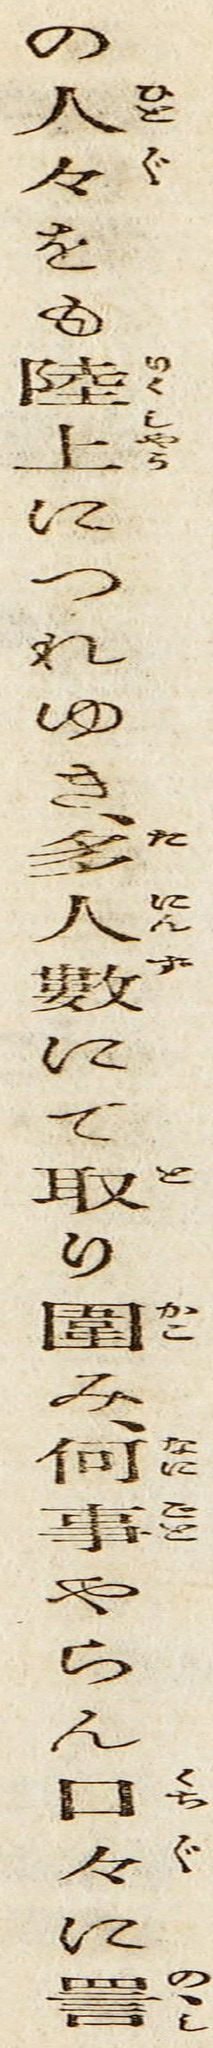の人々をも陸上につれゆき、多人数にて取り囲み、何事やらん口々に詈
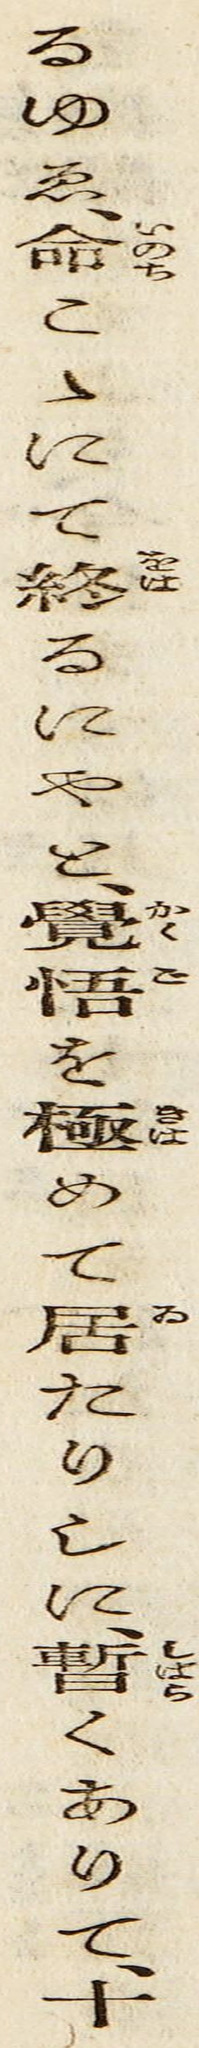るゆゑ、命こゝにて終るにやと、覚悟を極めて居たりしに、暫くありて、十
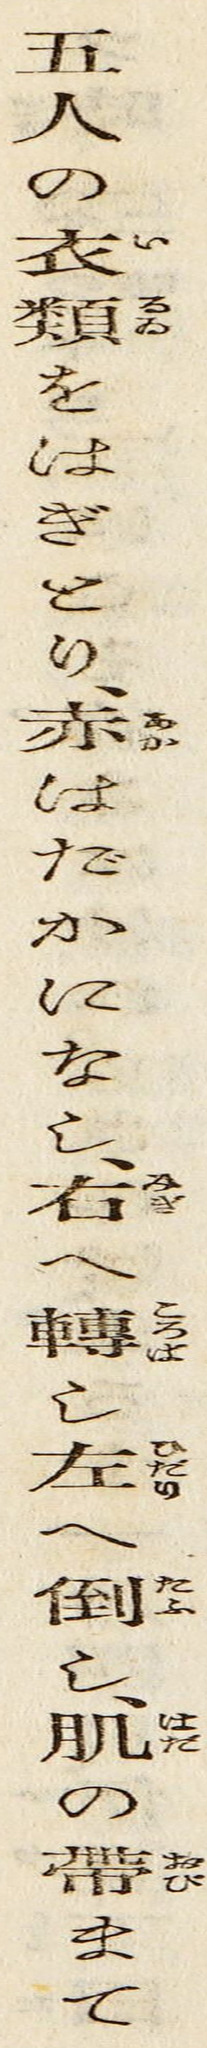五人の衣類をはぎとり、赤はだかになし、右へ転し左へ倒し、肌の帯まて
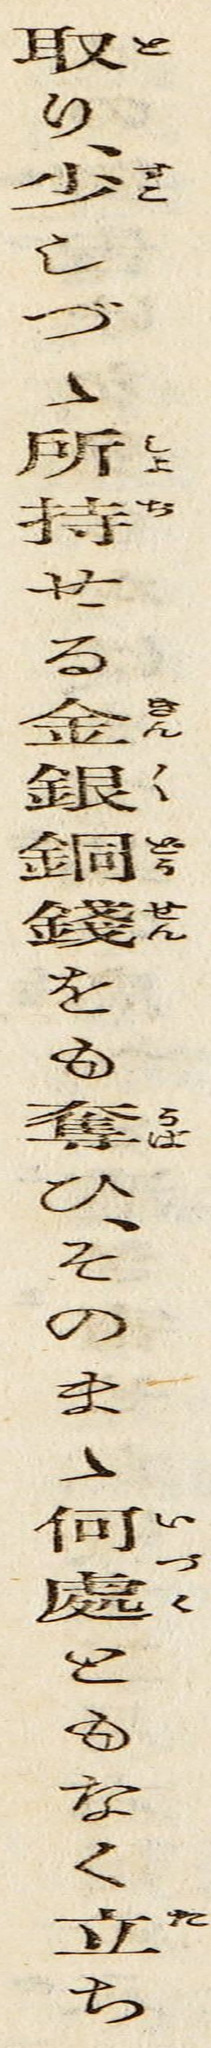取り、少しづゝ所持せる金銀銅銭をも奪ひ、そのまゝ何処ともなく立ち
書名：日本漂流譚
